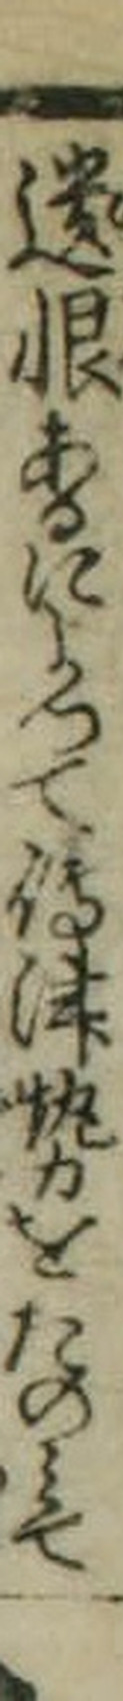遺恨あるによつて嶋津勢をたのみて
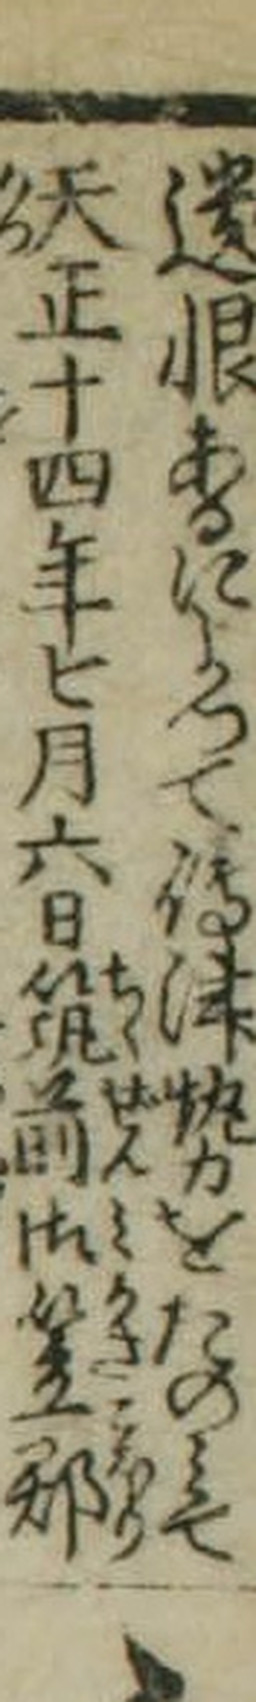天正十四年七月六日筑前御笠郡
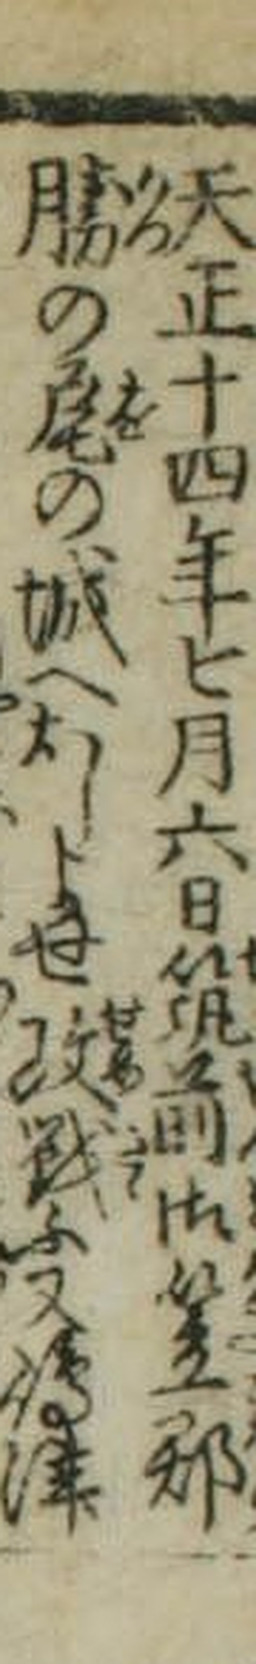勝の尾の城へおしよせ攻戦ふ又嶋津
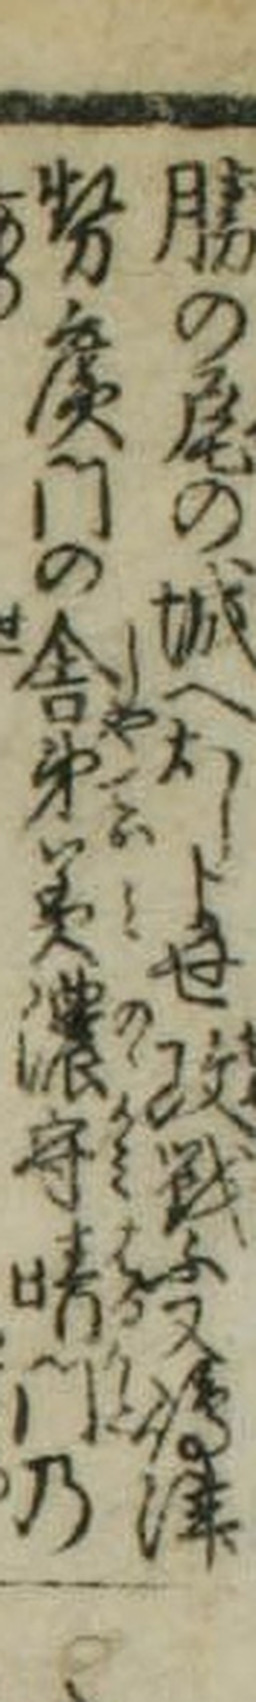勢広門の舎弟美濃守晴門の
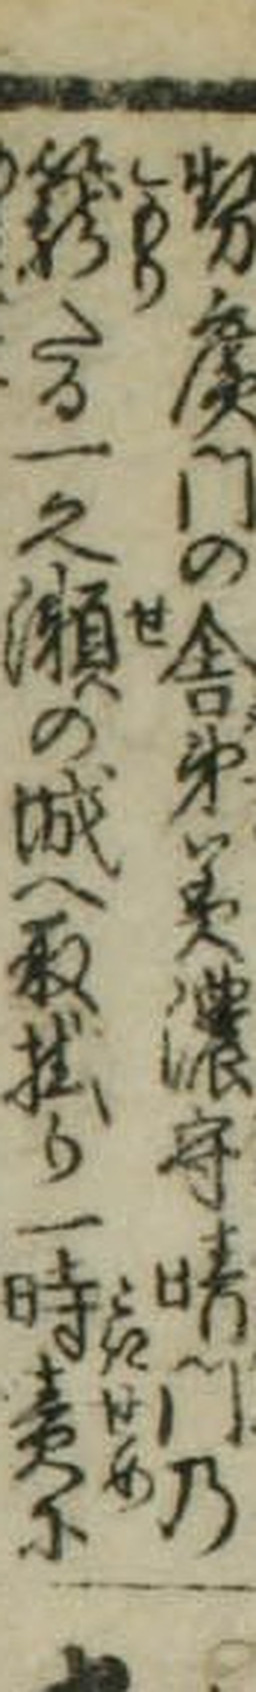籠たる一久瀬の城へ取掛り一時責に
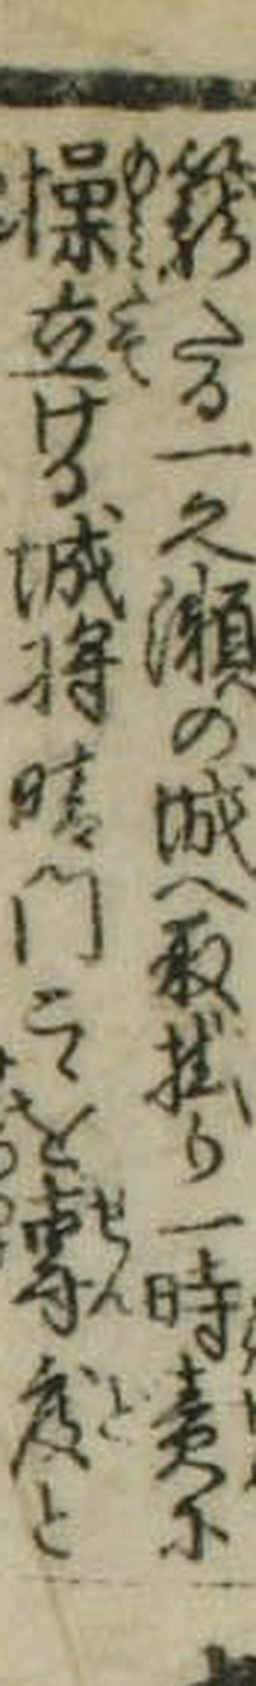操立ける城将晴門こゝを専度と
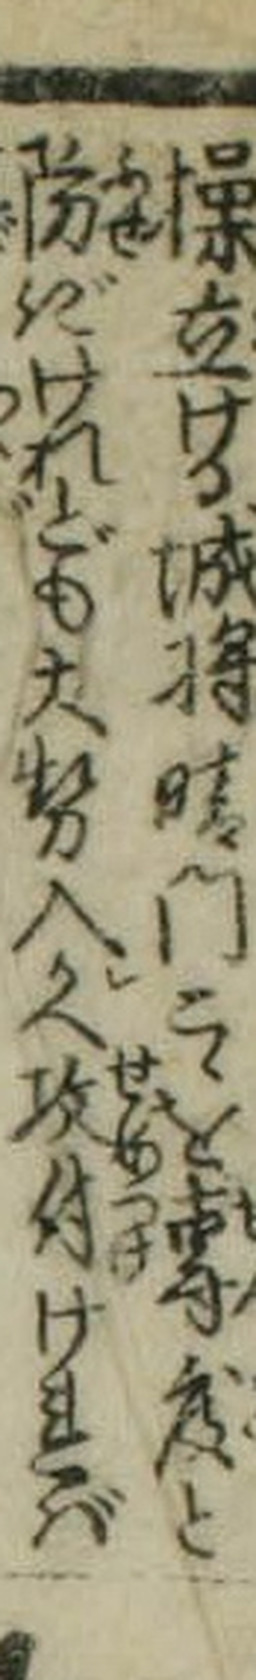防ぎけれども大勢入レかへ攻付ければ
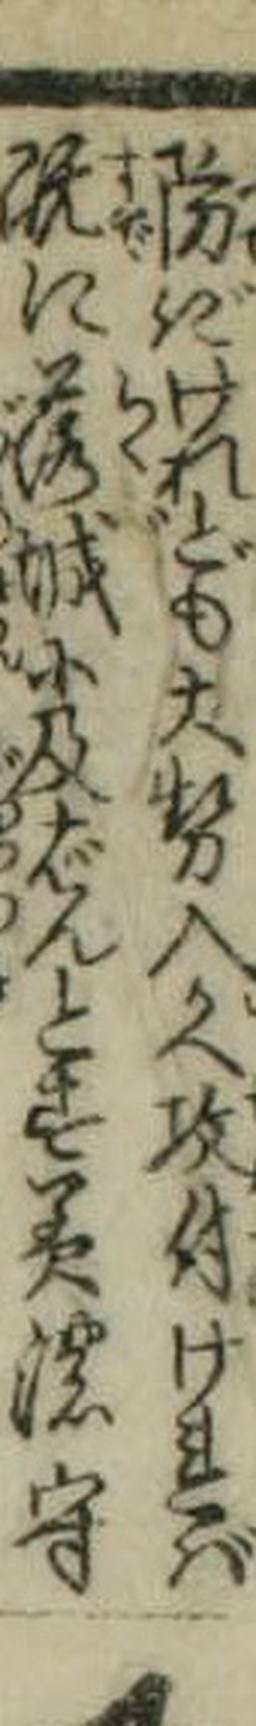既に落城に及ばんとす美濃守
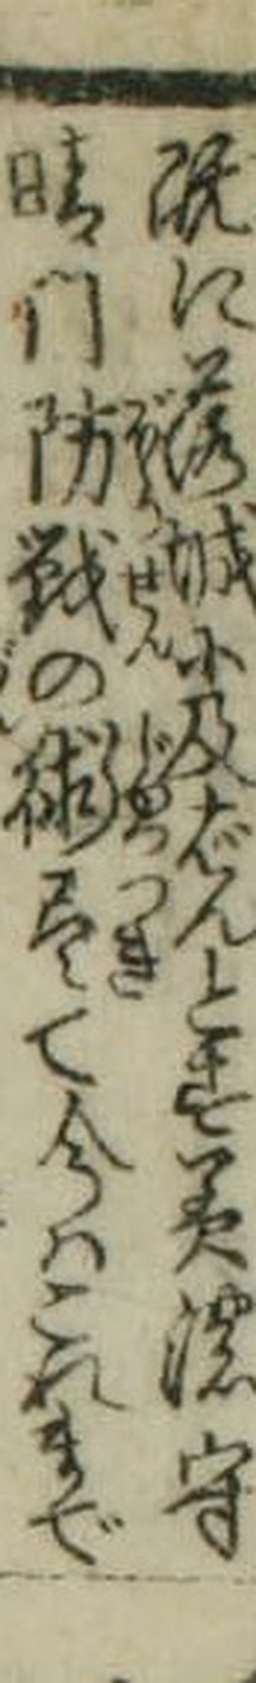晴門防戦の術尽て今はこれまで
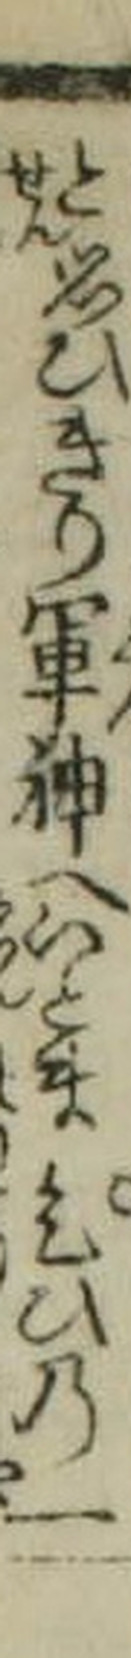と思ひきり軍神へいとま乞ひの一
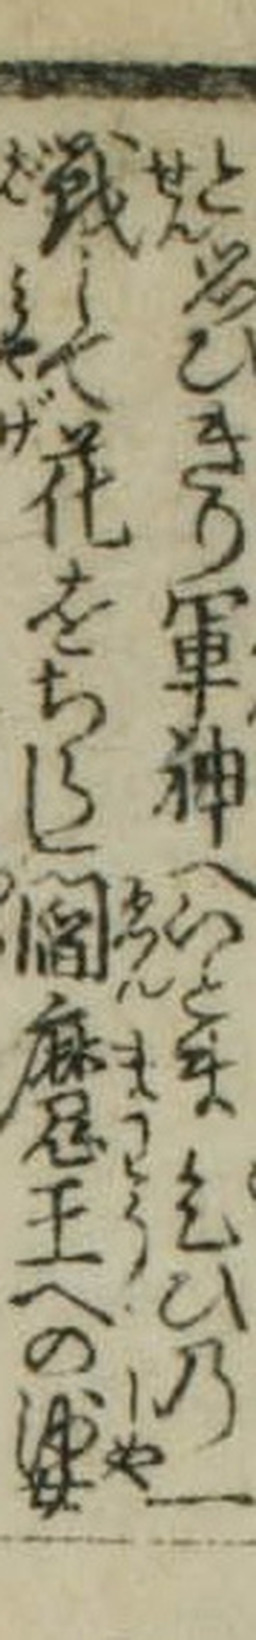戦して花をちらし閻魔王への娑
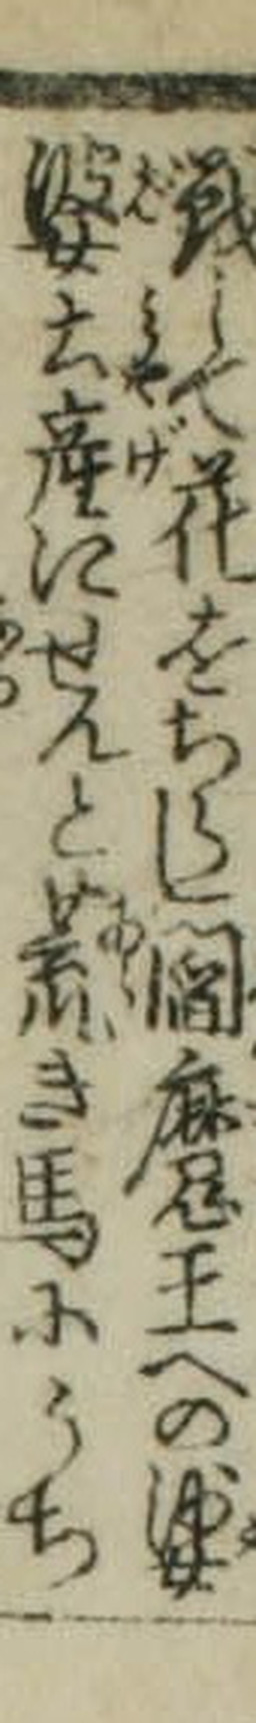婆土産にせんと荒き馬にうち
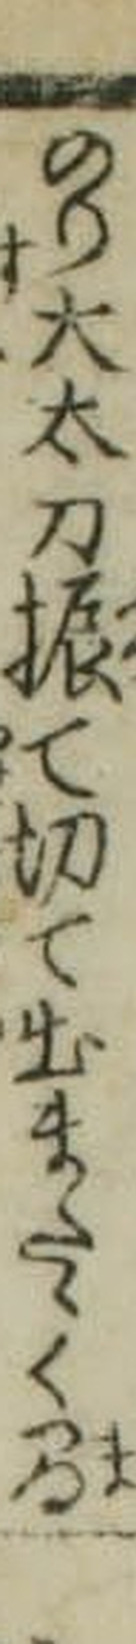のり大太刀振て切て出またゝく間
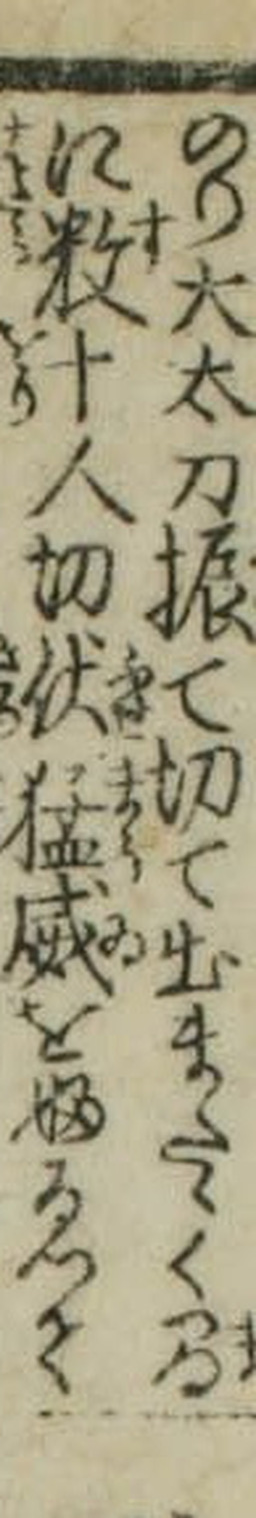に数十人切伏猛威をふるつて
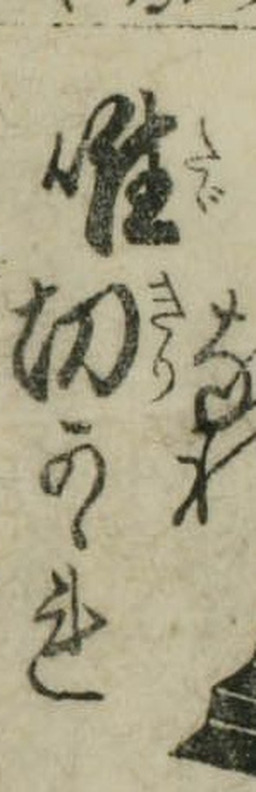唯切かゝれ
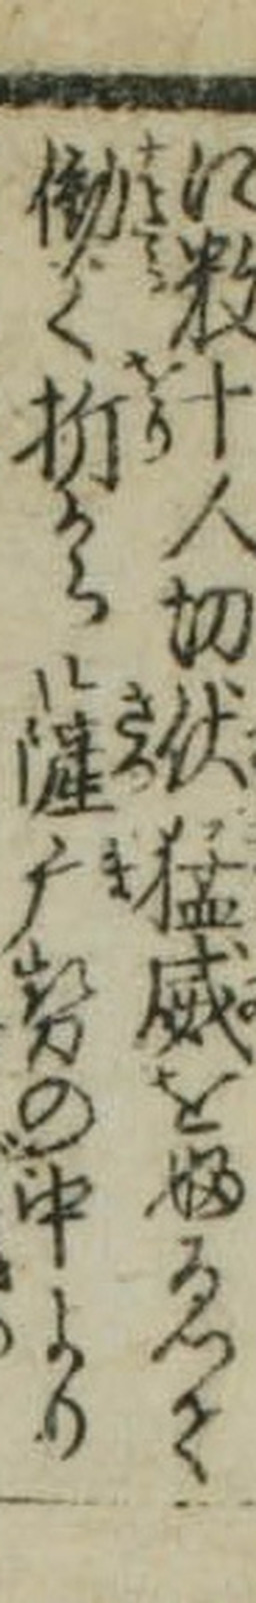働く折から薩摩勢の中より
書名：續英雄百人一首
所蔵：東京学芸大学附属図書館
